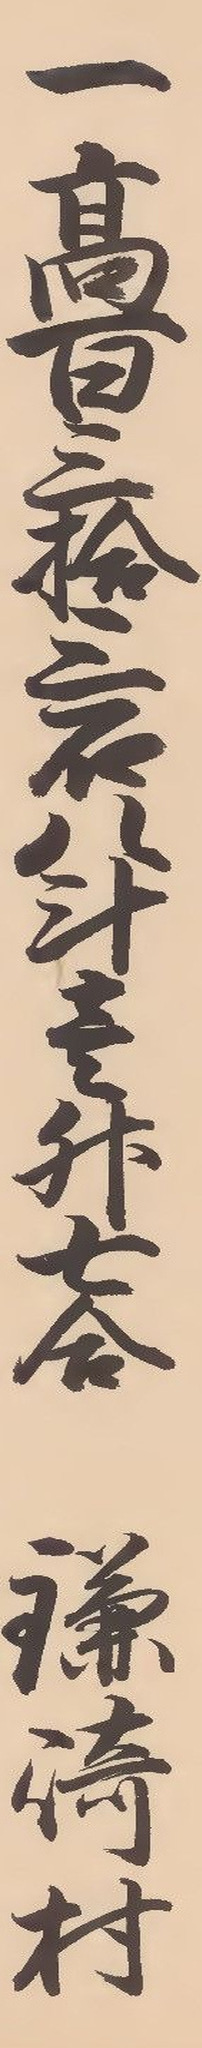一高百三拾三石八斗壱升七合鎌崎村
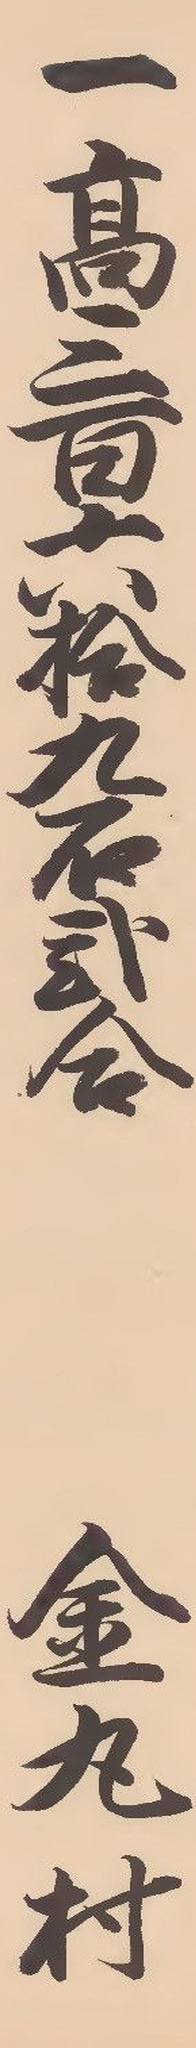一高三百六拾九石弐合金丸村
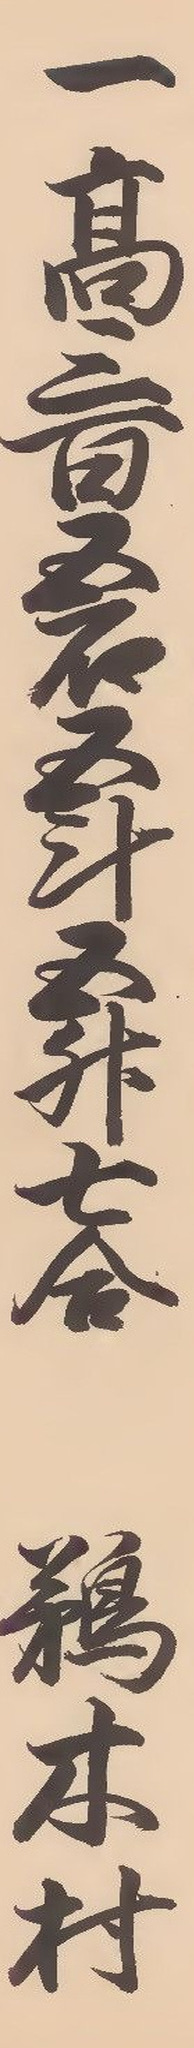一高三百五石五斗五升七合鵜木村

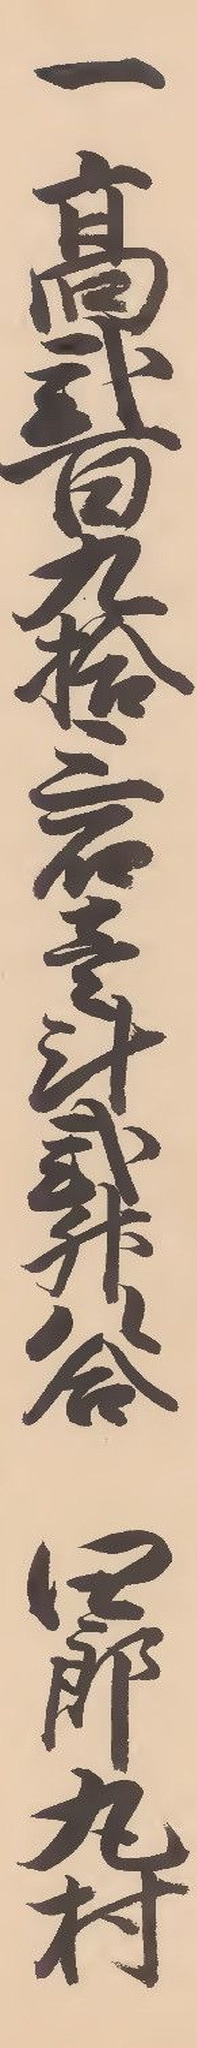一高弐百九拾三石壱斗弐升八合四郎丸村
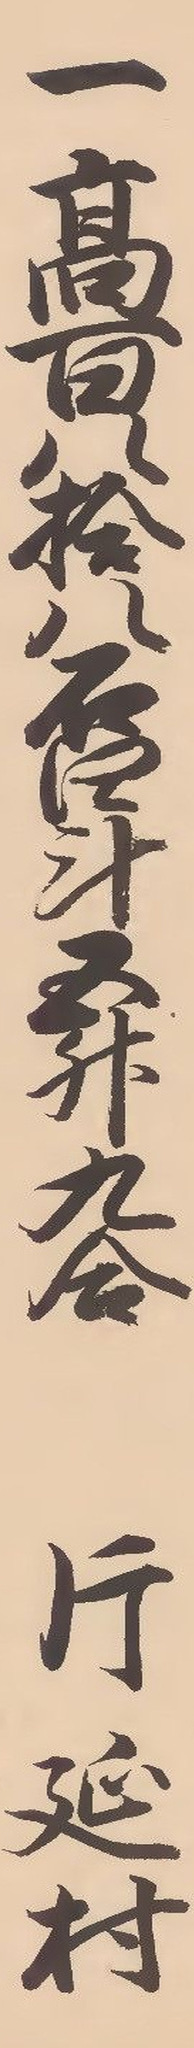一高百八拾八石四斗五升九合片延村
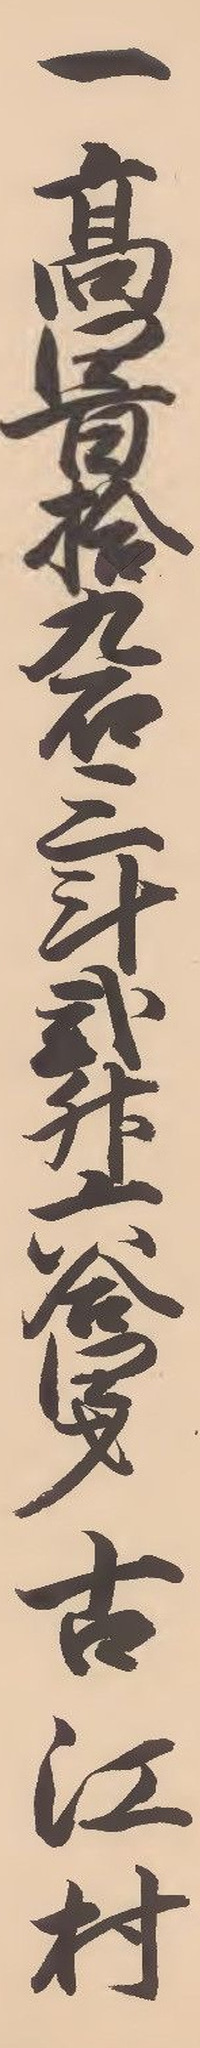一高四百拾九石三斗弐升六合四才古江村
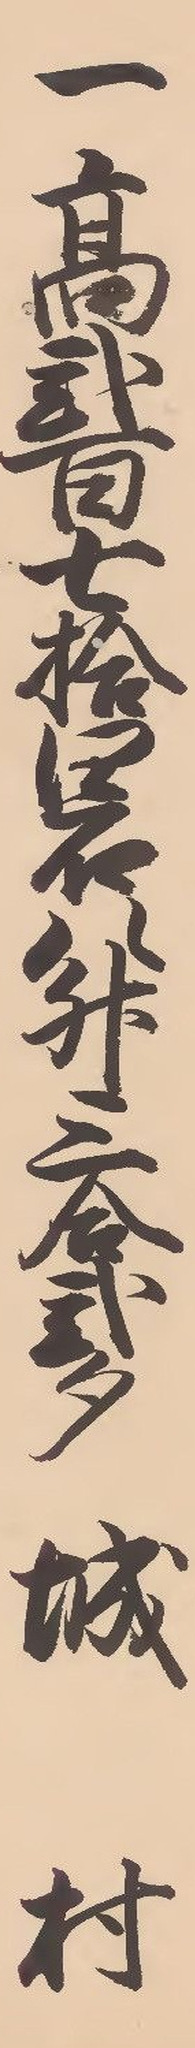一高弐百七拾四石八升三合弐勺城村
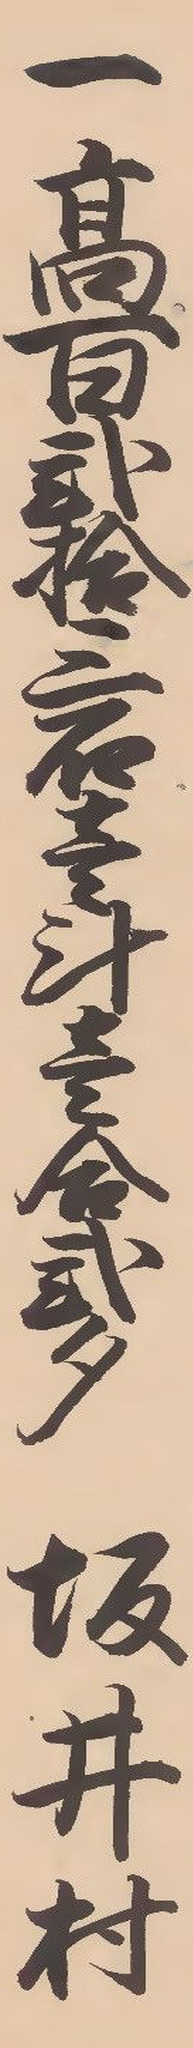一高百弐拾三石壱斗壱合弐勺坂井村
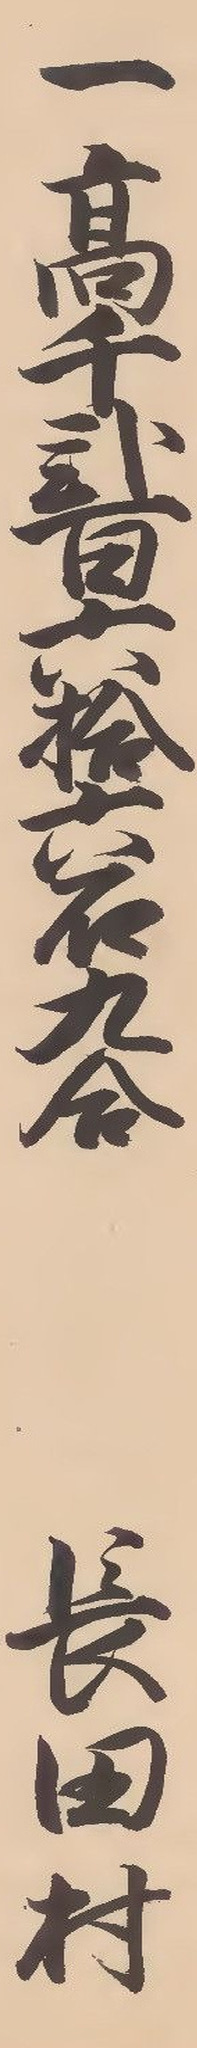一高千弐百六拾六石九合長田村
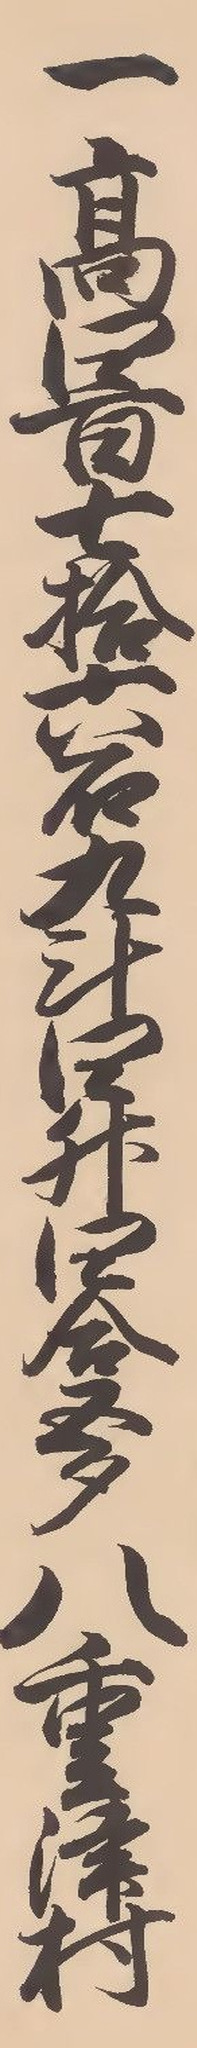一高四百七拾六石九斗四升四合五勺八重津村
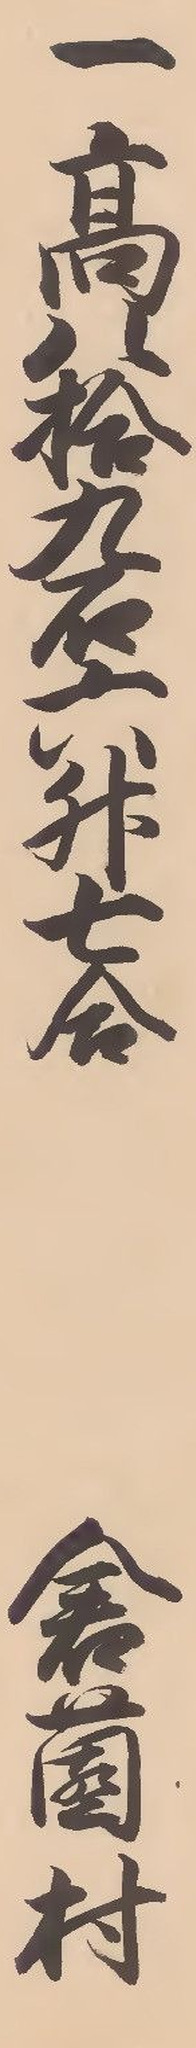一高八拾九石六升七合倉園村

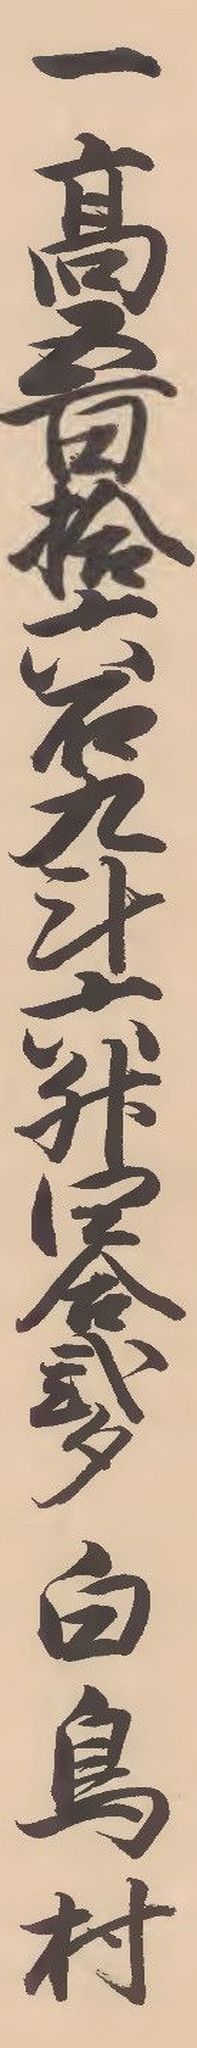一高五百拾六石九斗六升四合弐勺白鳥村
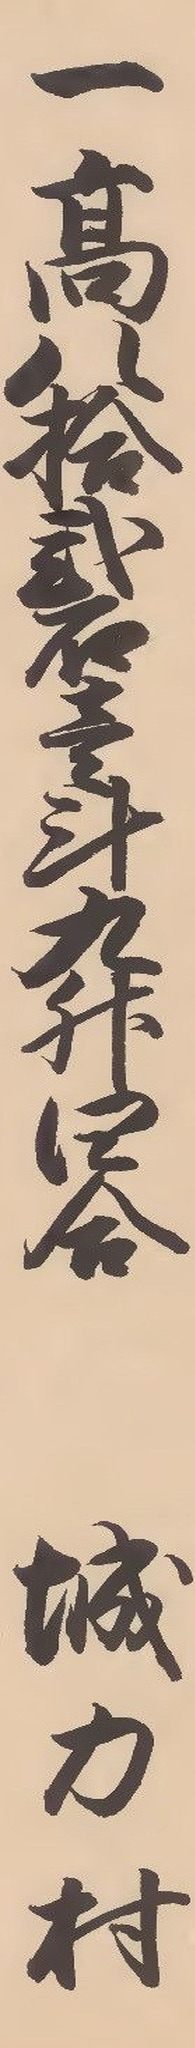一高八拾弐石壱斗九升四合城力村
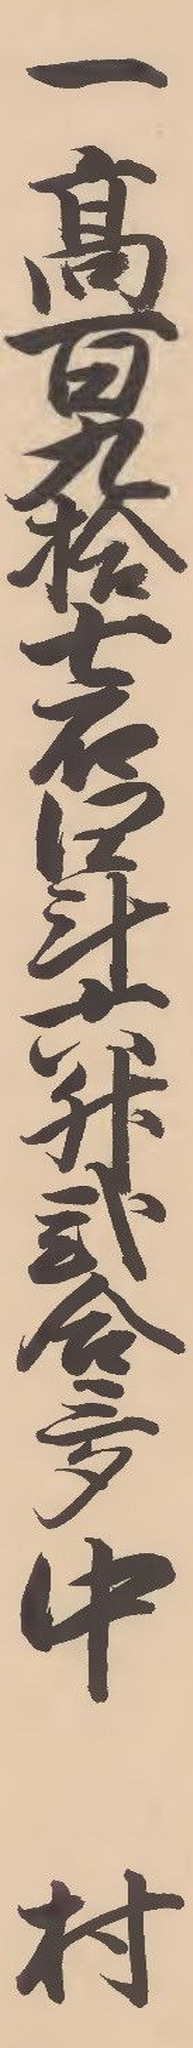一高百九拾七石四斗六升弐合三勺中村
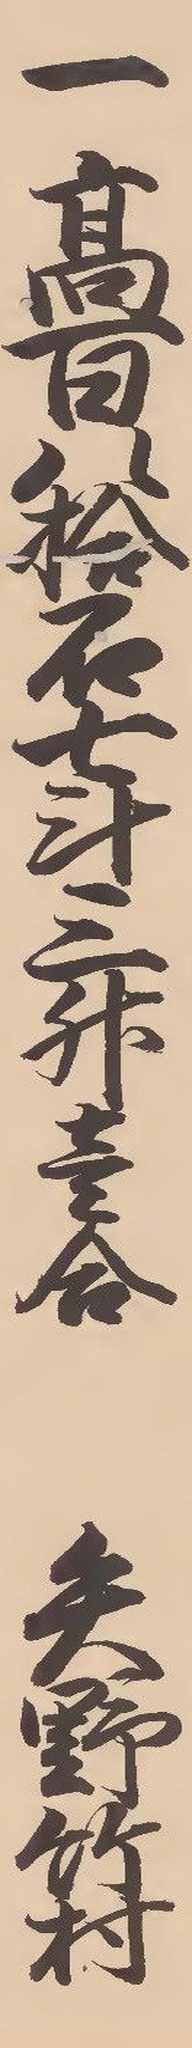一高百八拾石七斗三升壱合矢野竹村
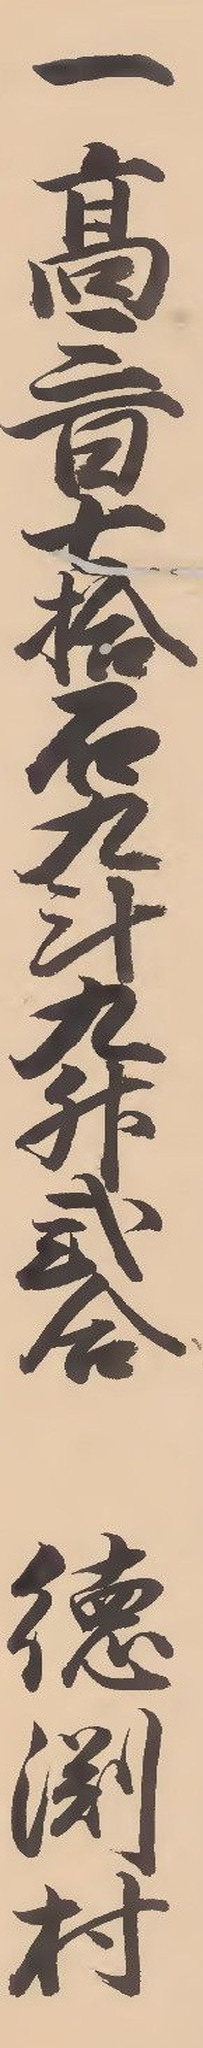一高三百七拾石九斗九升弐合徳渕村
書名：筑前国郷帳
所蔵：国立公文書館 National Archives of Japan
